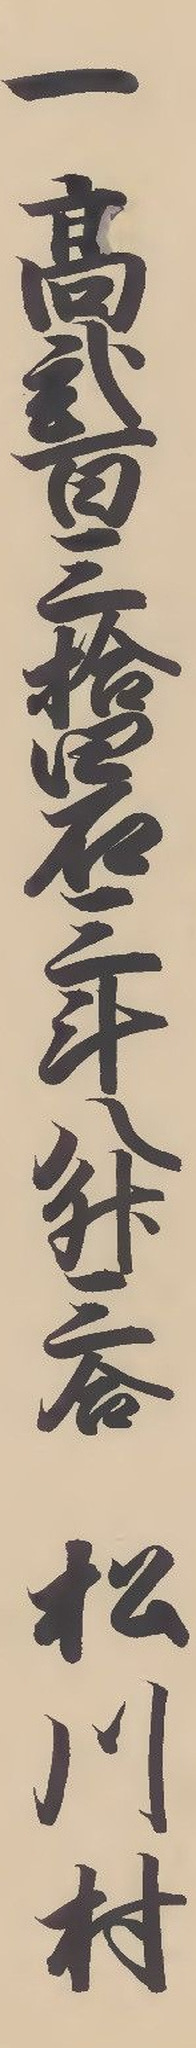一高弐百三拾四石三斗八升三合松川村
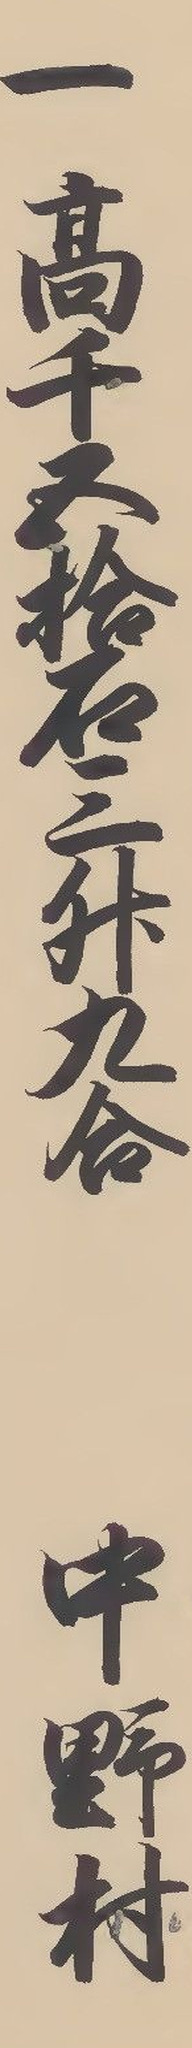一高千五拾石三升九合中野村
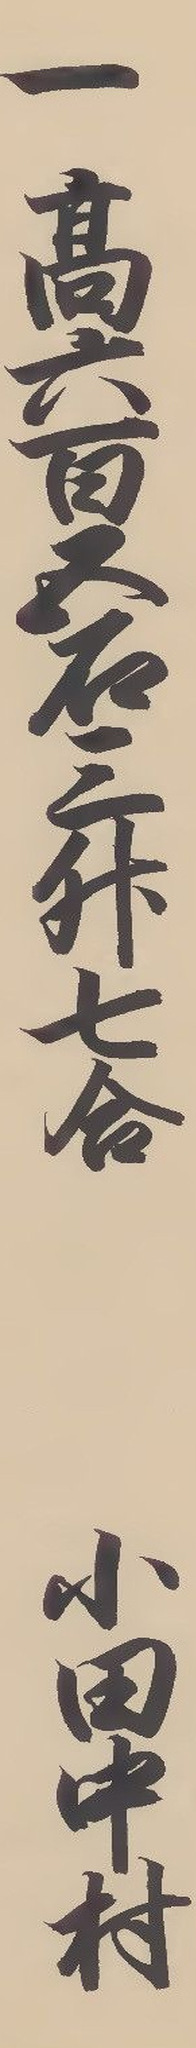一高六百五石三升七合小田中村
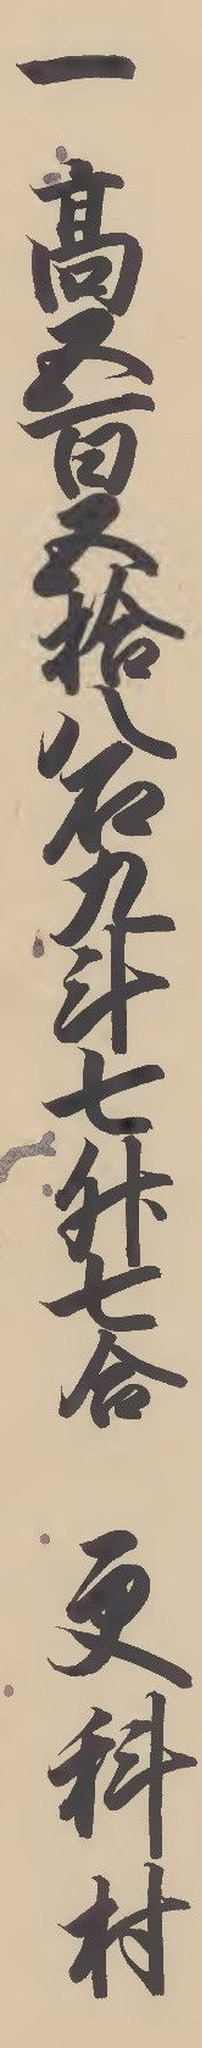一高五百五拾八石九斗七升七合更科村

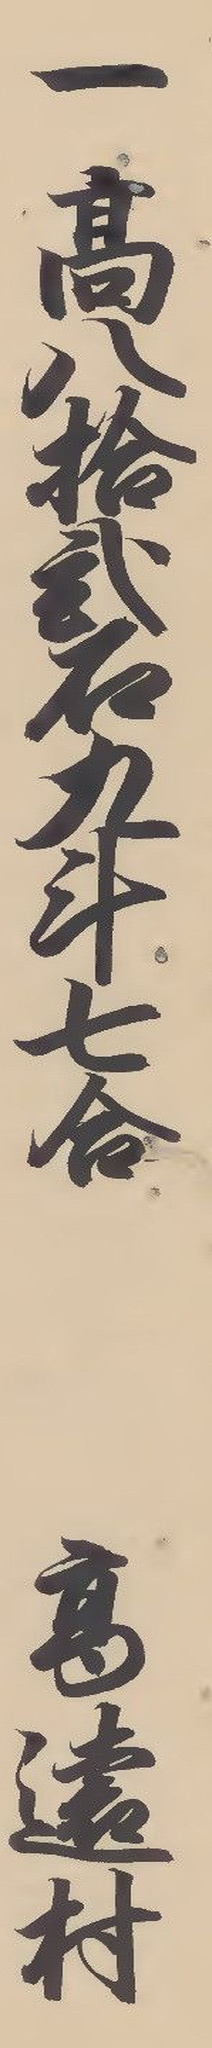一高八拾弐石九斗七合高遠村
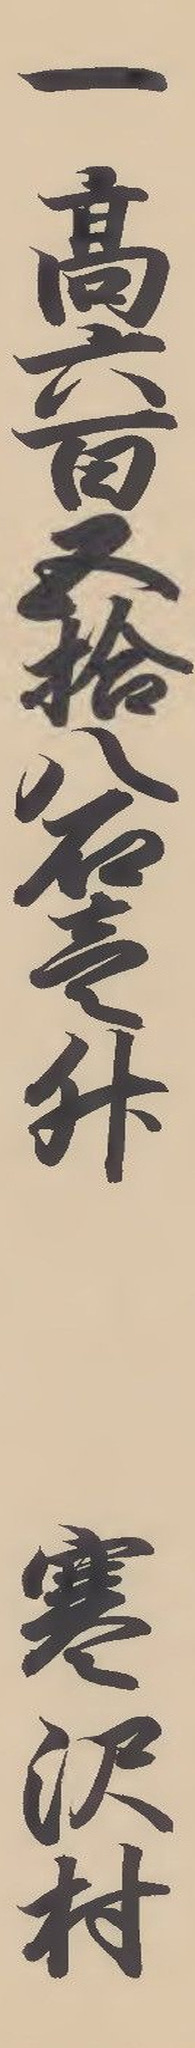一高六百五拾八石壱升寒沢村
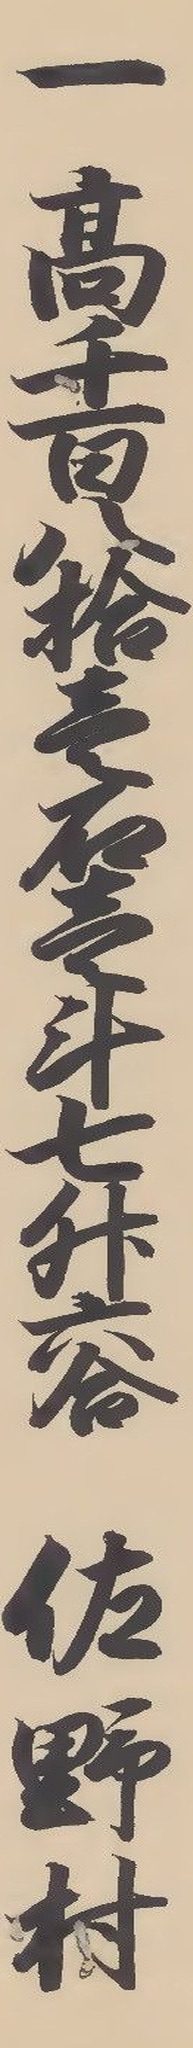一高千百八拾壱石壱斗七升六合佐野村
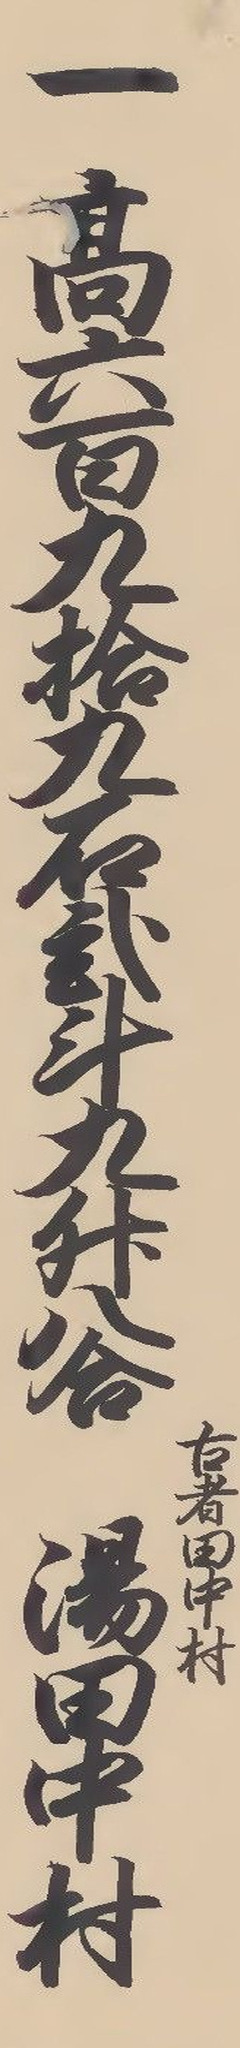一高六百九拾九石弐斗九升八合湯田中村
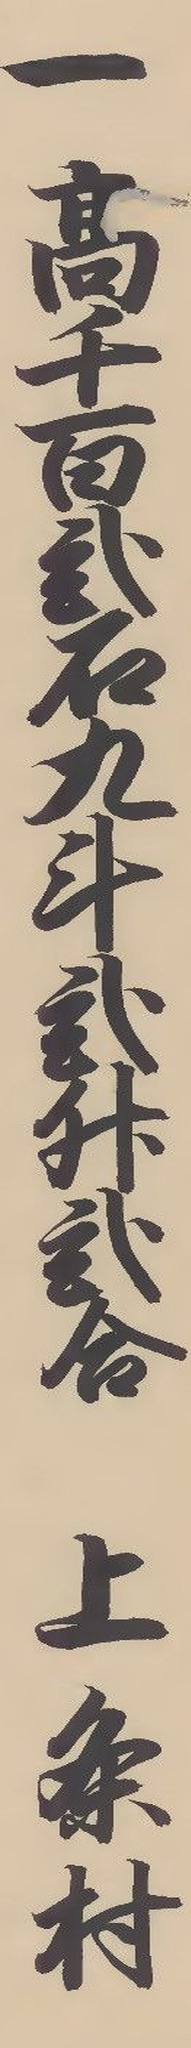一高千百弐石九斗弐升弐合上条村
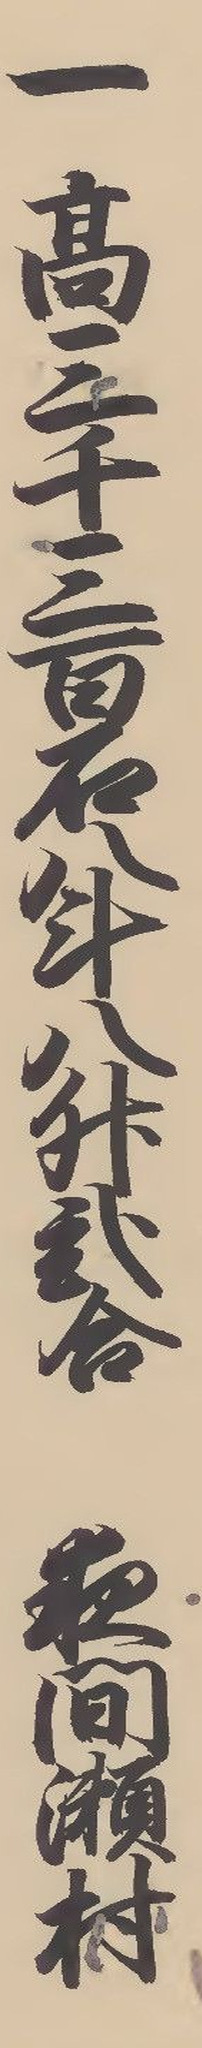一高三千三百石八斗八升弐合夜間瀬村
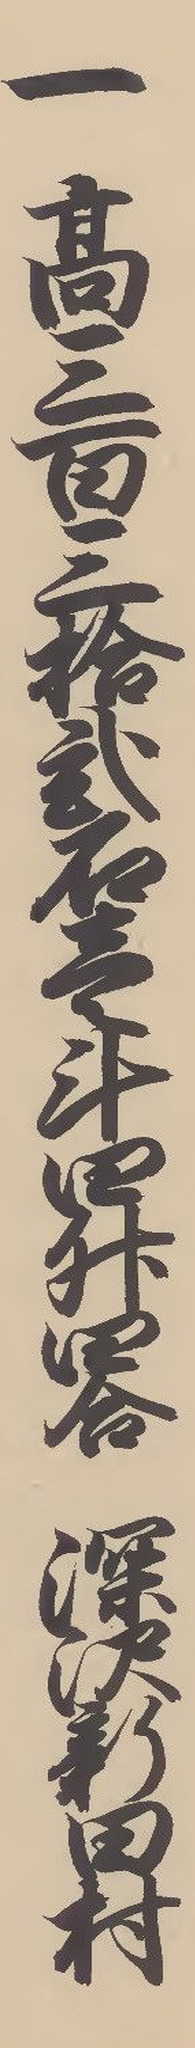一高三百三拾弐石壱斗四升四合深沢新田村
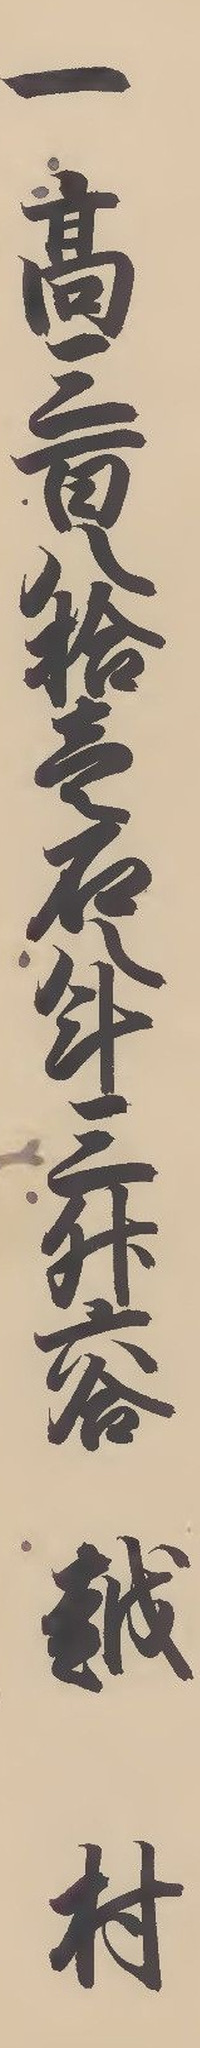一高三百八拾壱石八斗三升六合越村

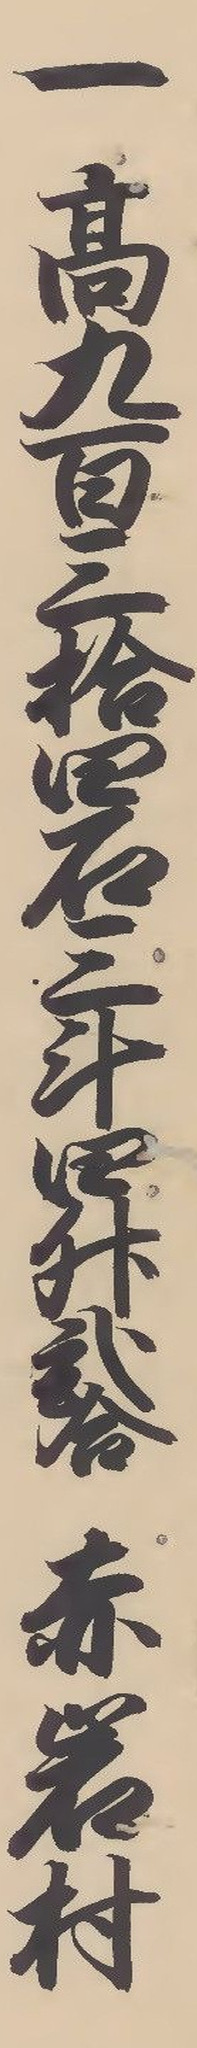一高九百三拾四石三斗四升弐合赤岩村
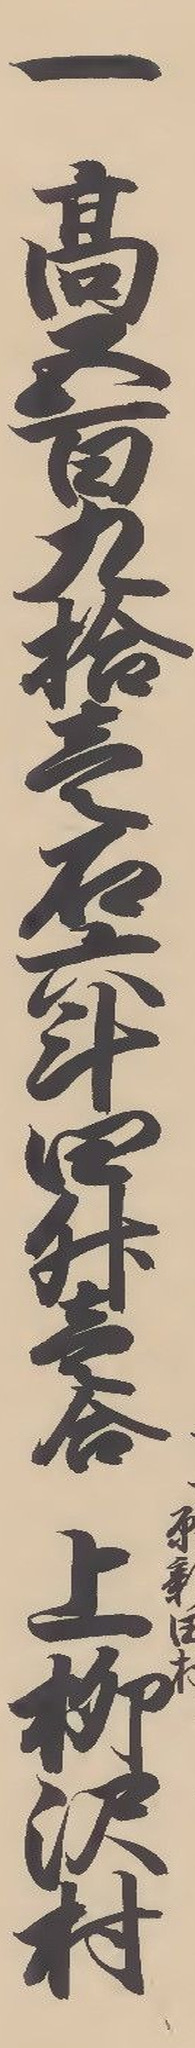一高五百九拾壱石六斗四升壱合上柳沢村
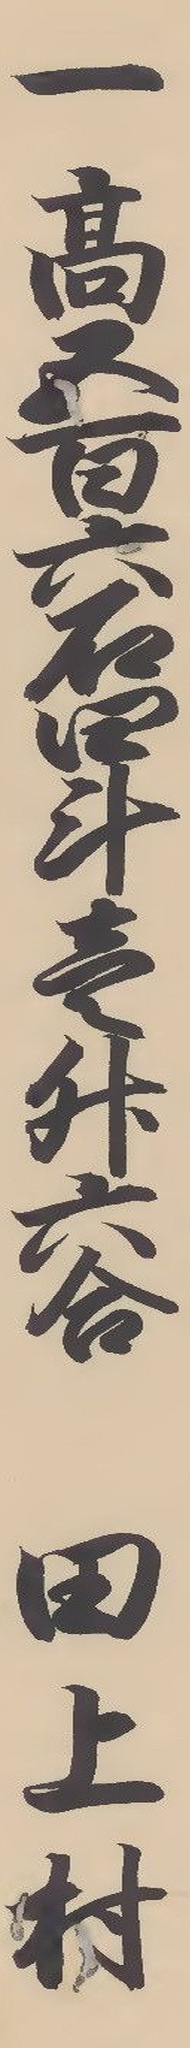一高五百六石四斗壱升六合田上村
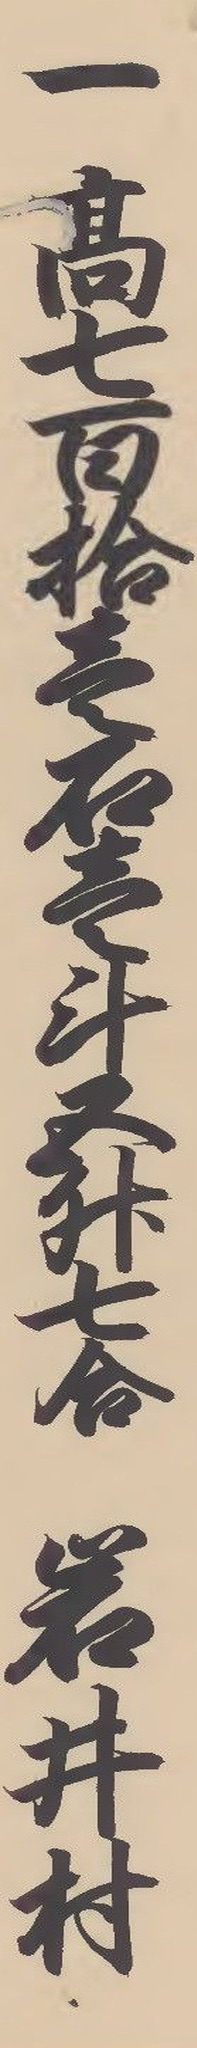一高七百拾壱石壱斗五升七合岩井村
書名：信濃国郷帳
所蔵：国立公文書館 National Archives of Japan
